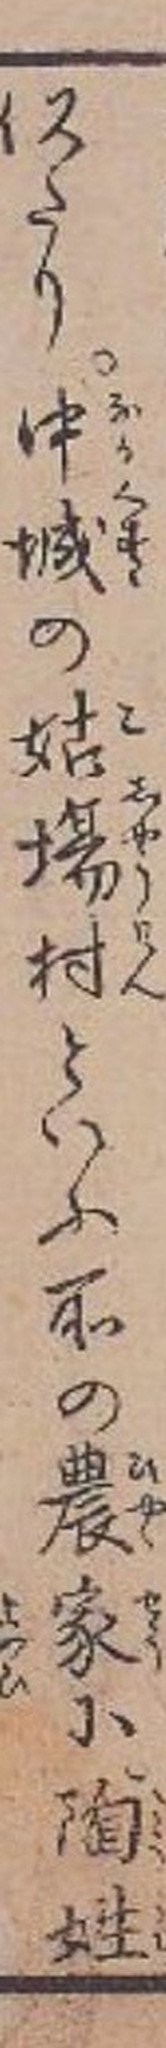似たり、中城の姑場村といふ所の農家に陶姓
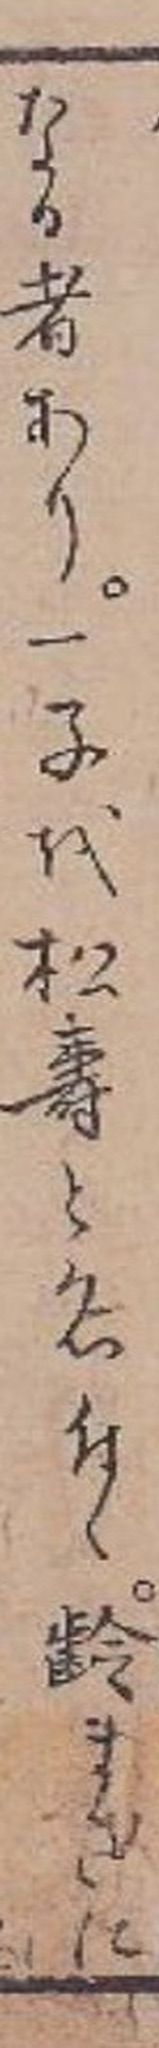なる者あり、一子を松寿と名付く、齢まさに
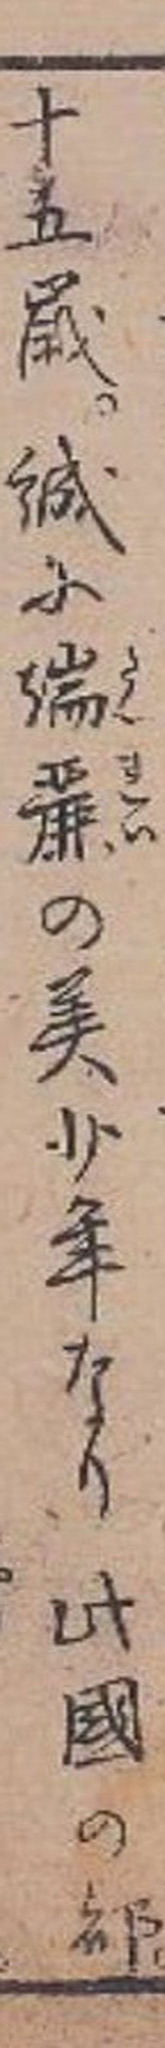十五歳、誠に端麗の美少年なり此国の都、
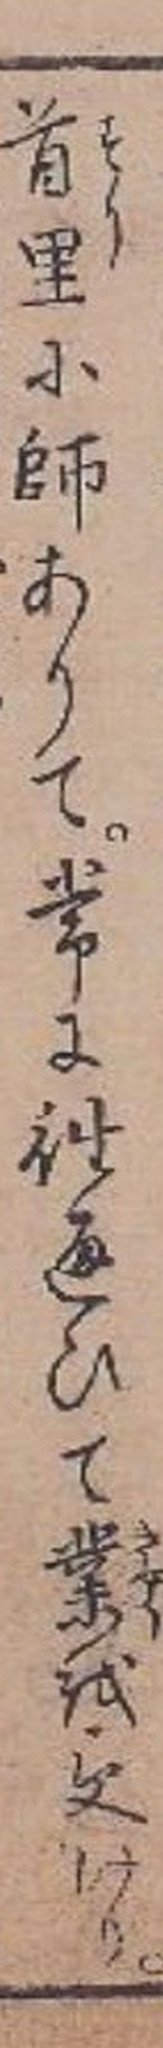首里に師ありて、常に往通ひて業を受けり、
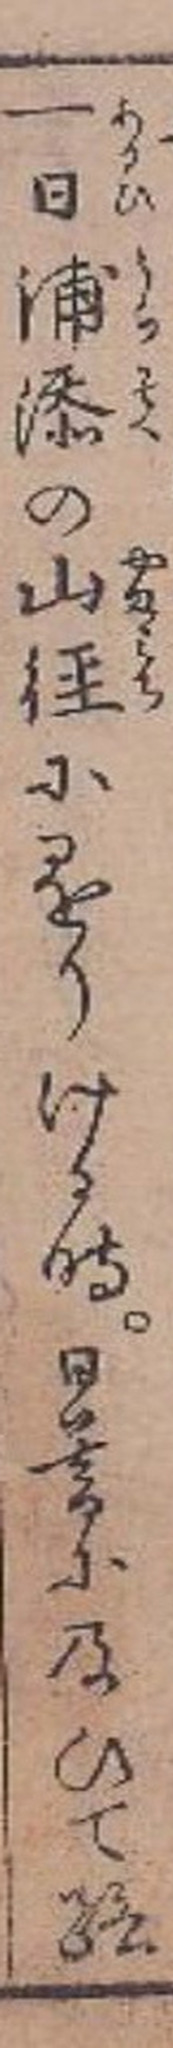一日浦添の山径に懸りける時、日暮に及ひて路

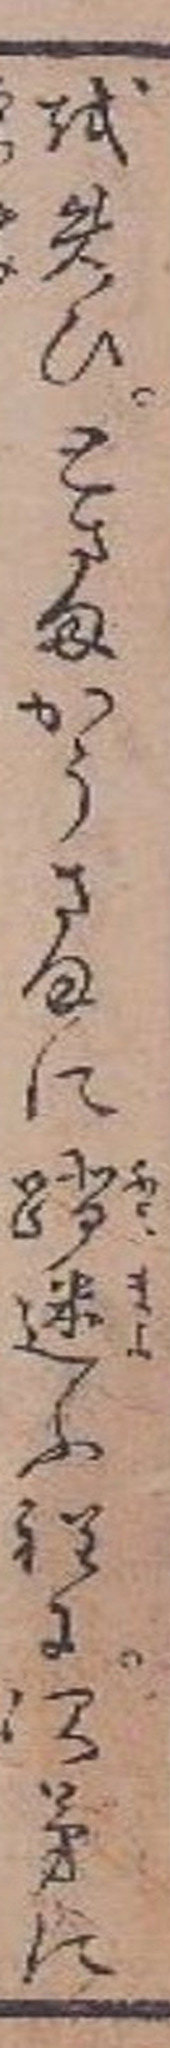を失ひ、とさまかうさまに踏迷ふ程に、次第に
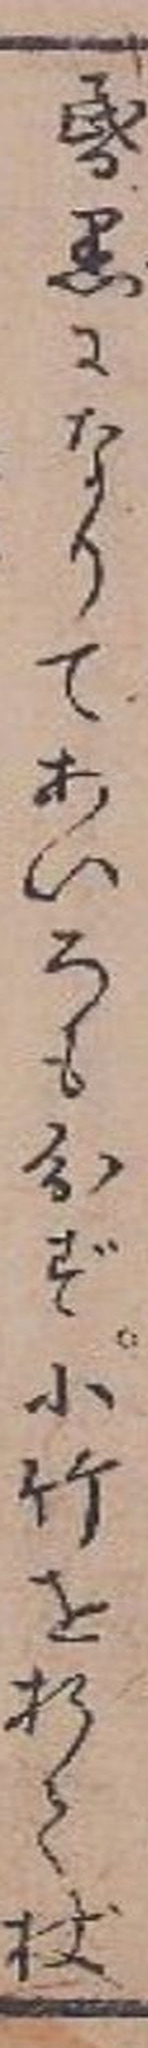昏黒になりてあいろも分ず、小竹を折て杖
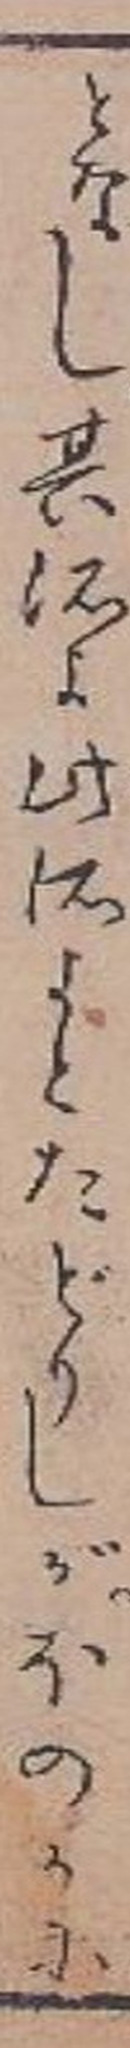となし、其所よ此所よとたどりしが、ほのかに
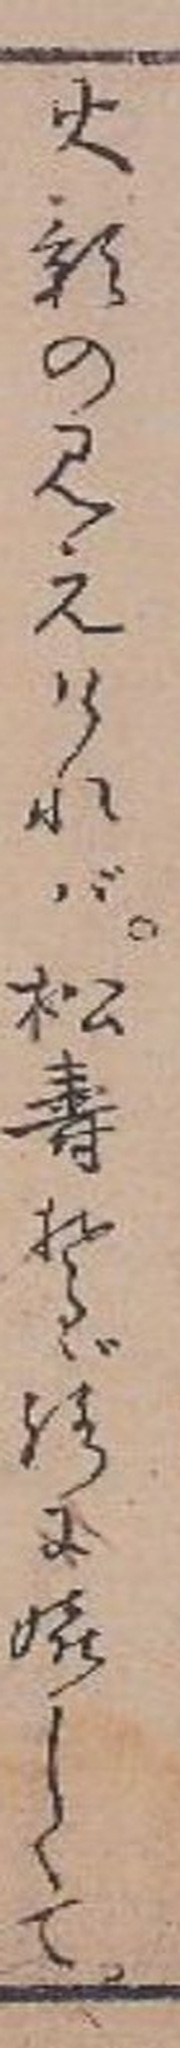火影の見えければ、松寿そゞろに嬉しくて、
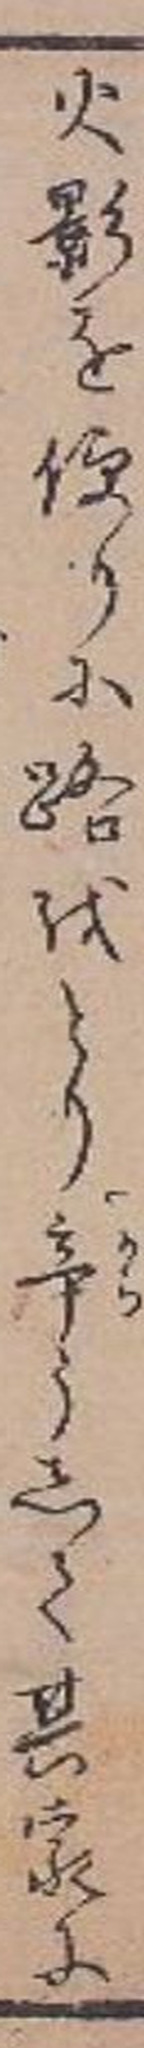火影を便りに路をとり、辛うして其家に
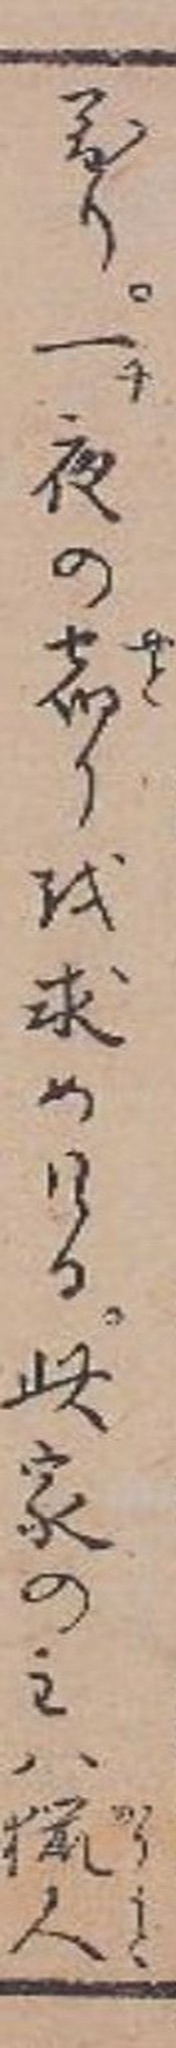到り、一夜の宿りを求めける。此家の主は猟人
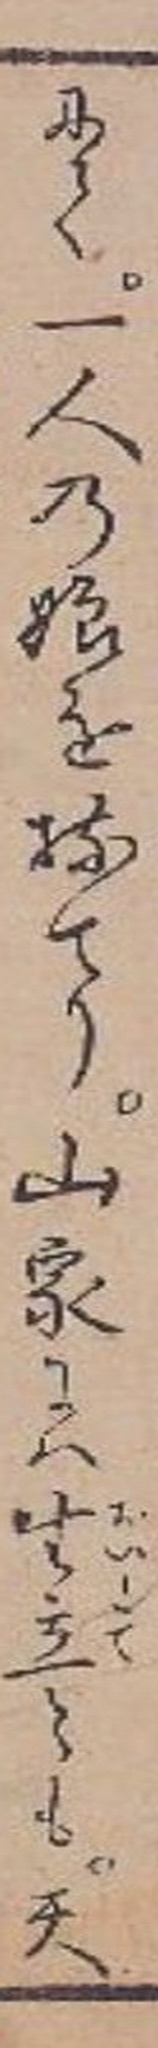にて、一人の娘を持てり、山家には生立とも、天
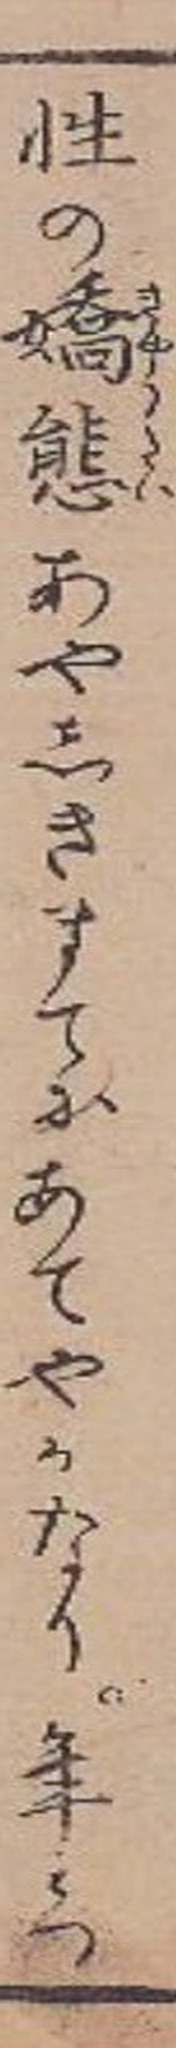性の嬌態あやしきまてにあてやかなり、年はつ
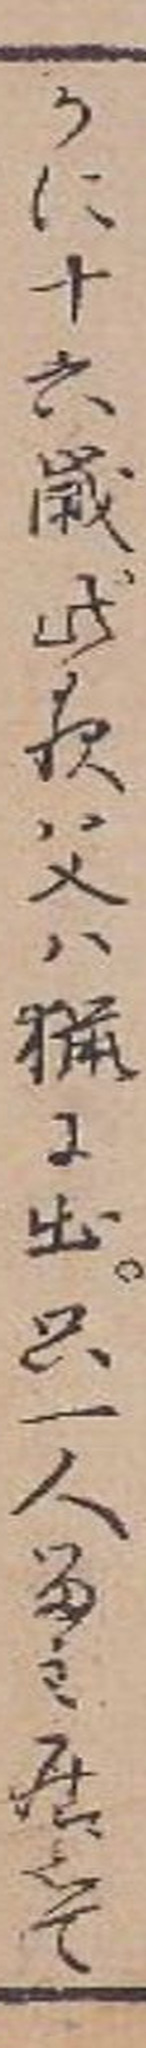かに十六歳、此夜父は猟に出、只一人留主居して
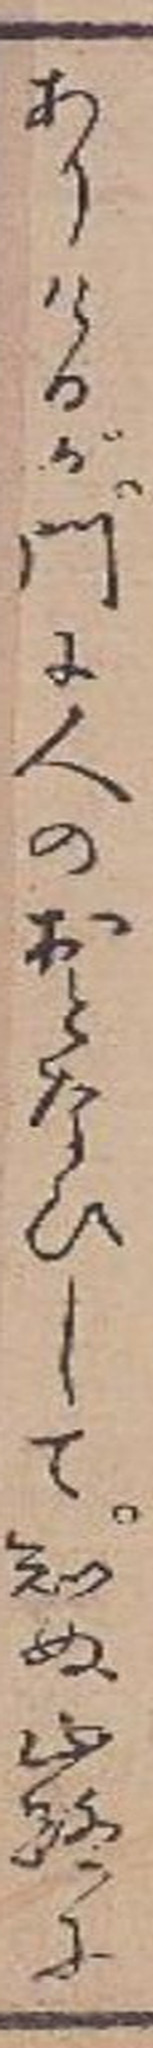ありけるが、門に人のおとなひして、知ぬ山路に
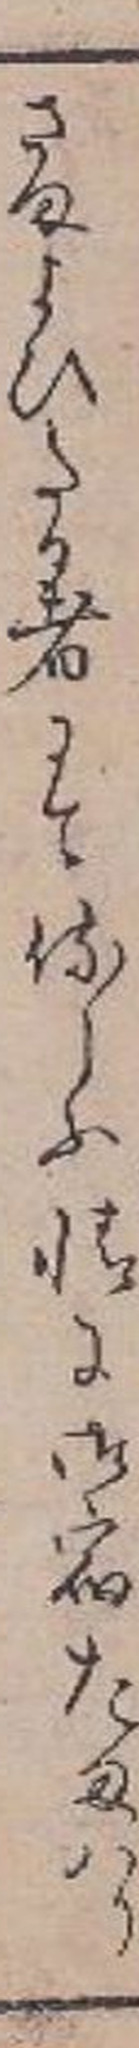さまよひたる者にて侍らふ、情に御宿たまはり
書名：琉球談
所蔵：University of the Ryukyus Library
